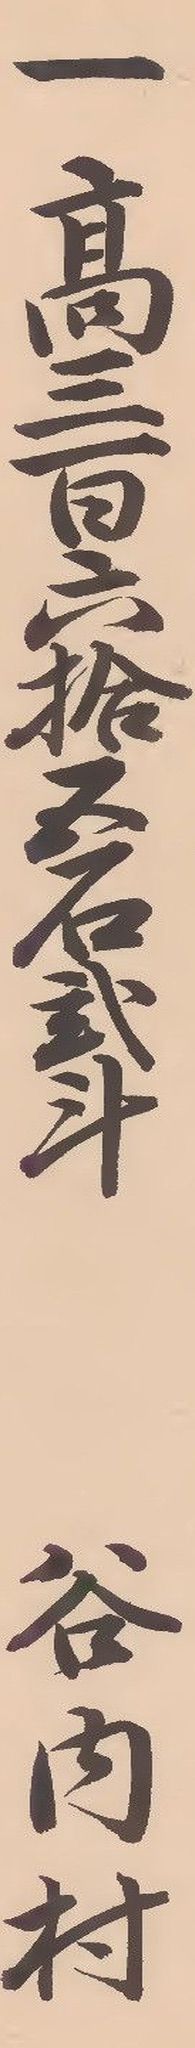一高三百六拾五石弐斗谷内村

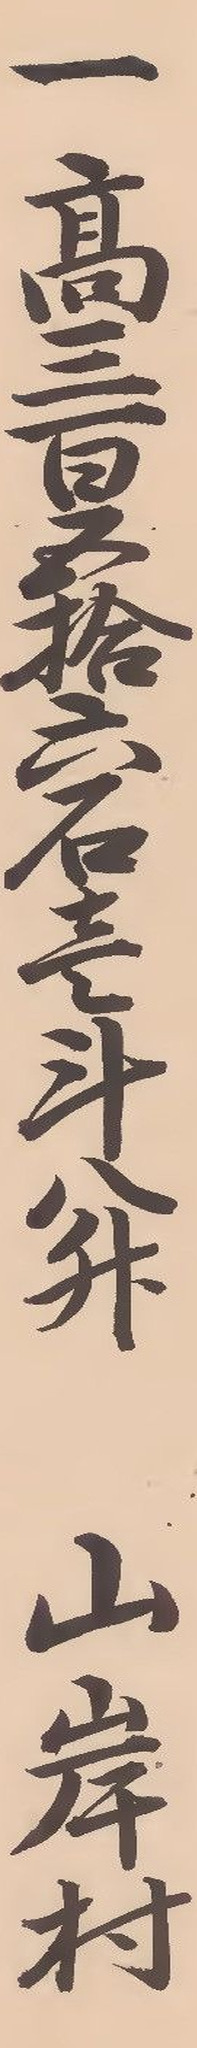一高三百五拾六石壱斗八升山岸村
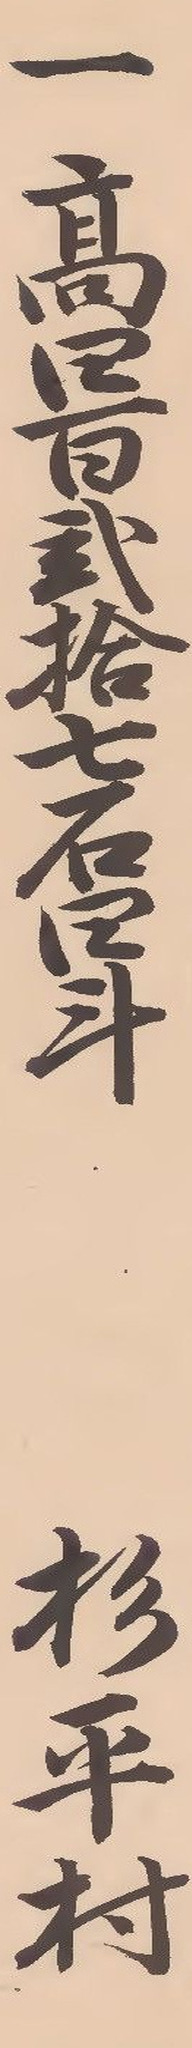一高四百弐拾七石四斗杉平村
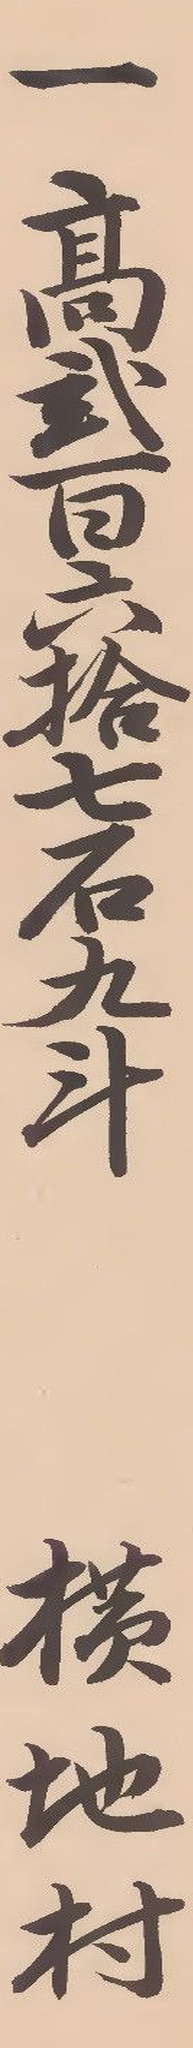一高弐百六拾七石九斗横地村
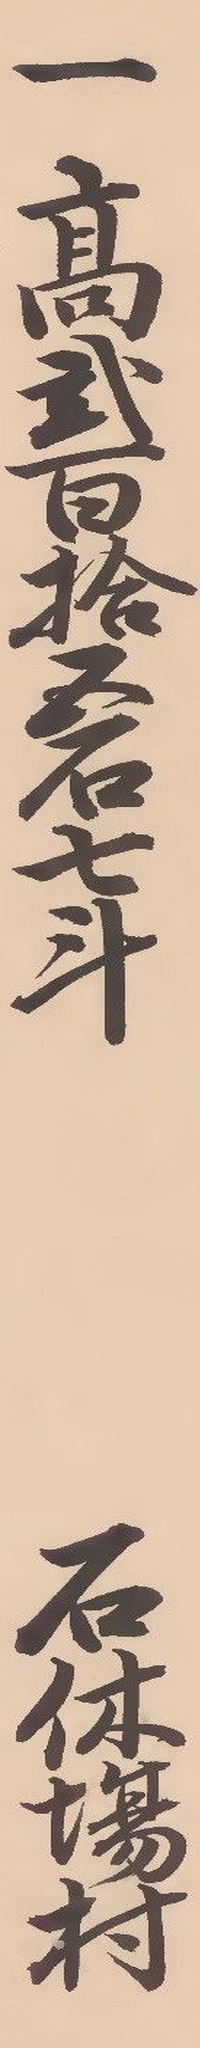一高弐百拾五石七斗石休場村
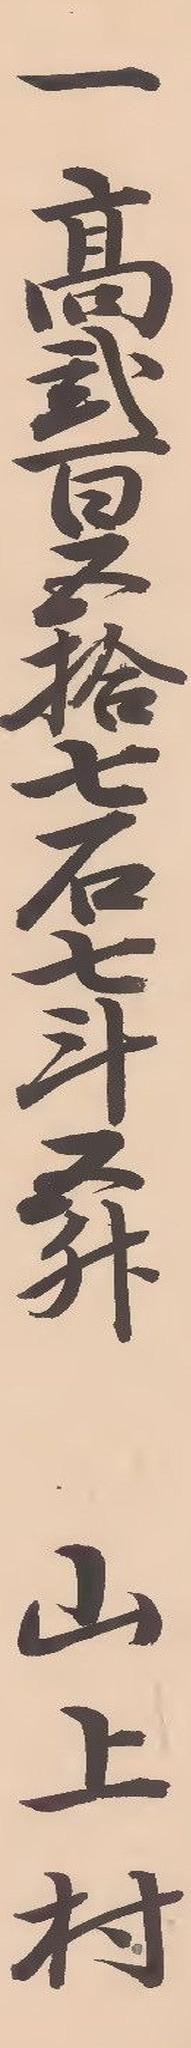一高弐百五拾七石七斗五升山上村
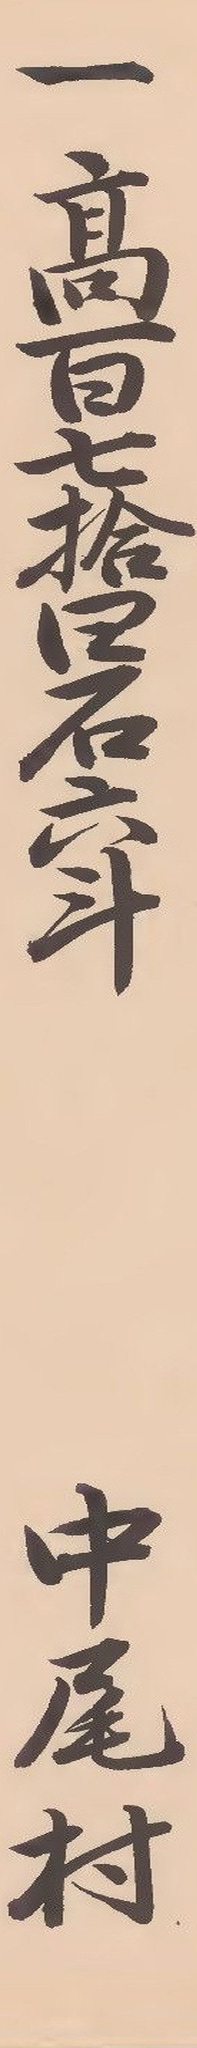一高百七拾四石六斗中尾村

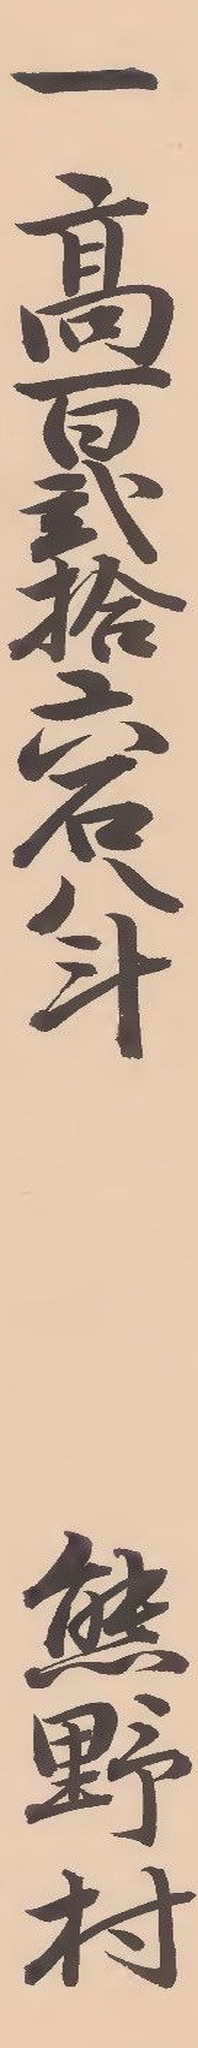一高百弐拾六石八斗熊野村
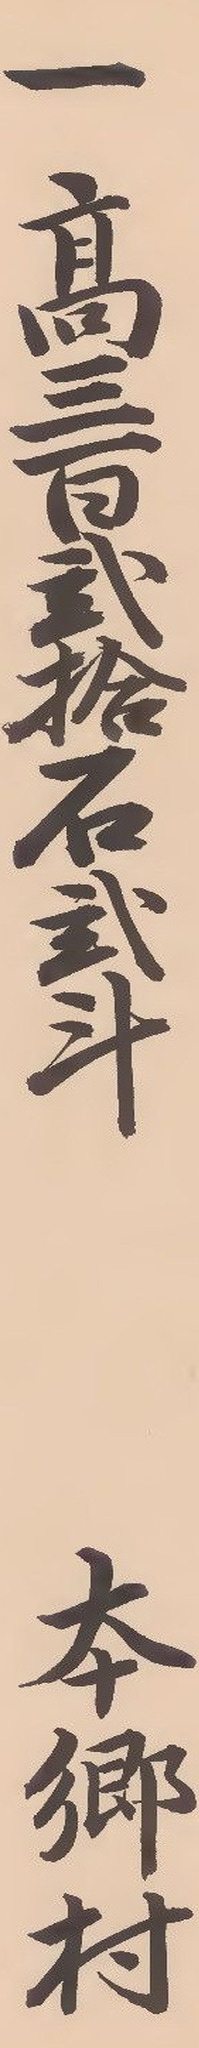一高三百弐拾石弐斗本郷村
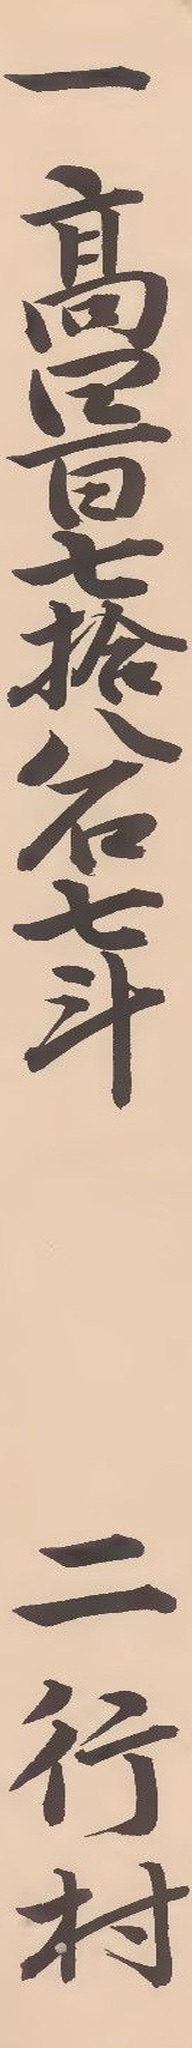一高四百七拾八石七斗二行村
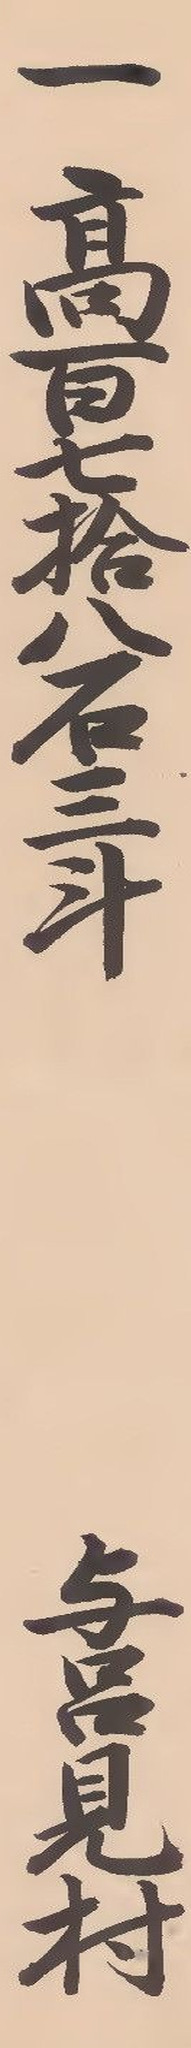一高百七拾八石三斗与呂見村
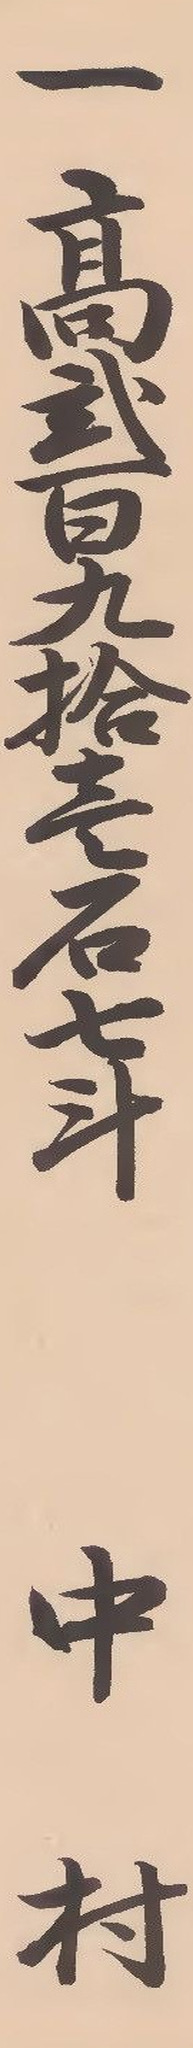一高弐百九拾壱石七斗中村
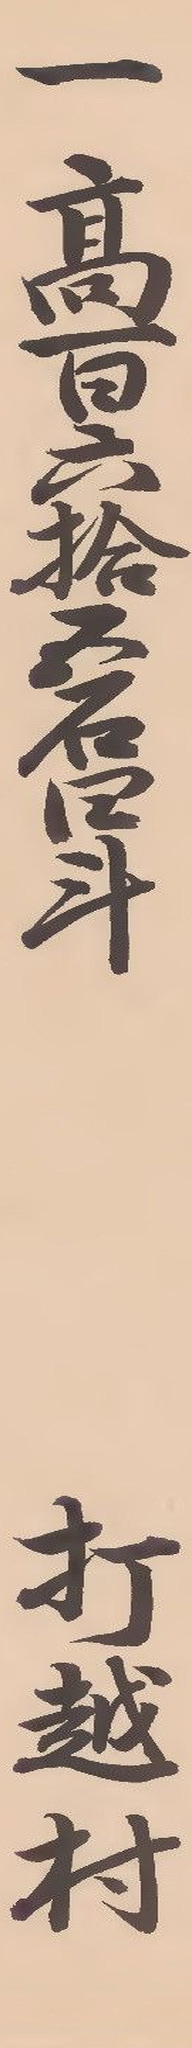一高百六拾五石四斗打越村
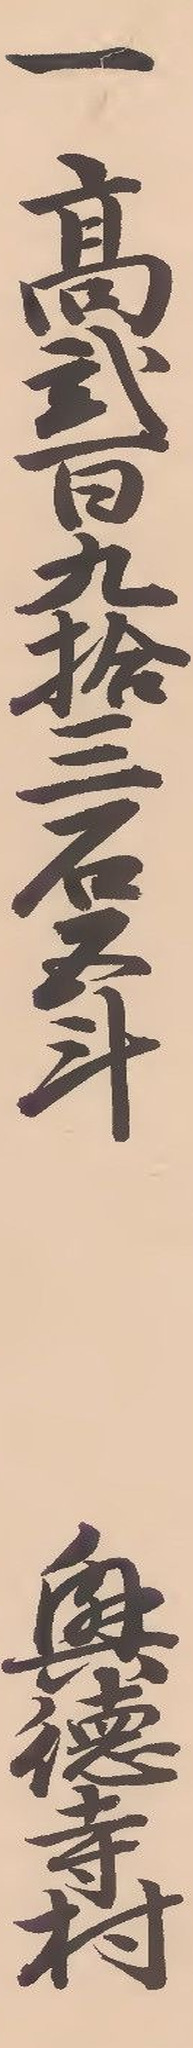一高弐百九拾三石五斗興徳寺村

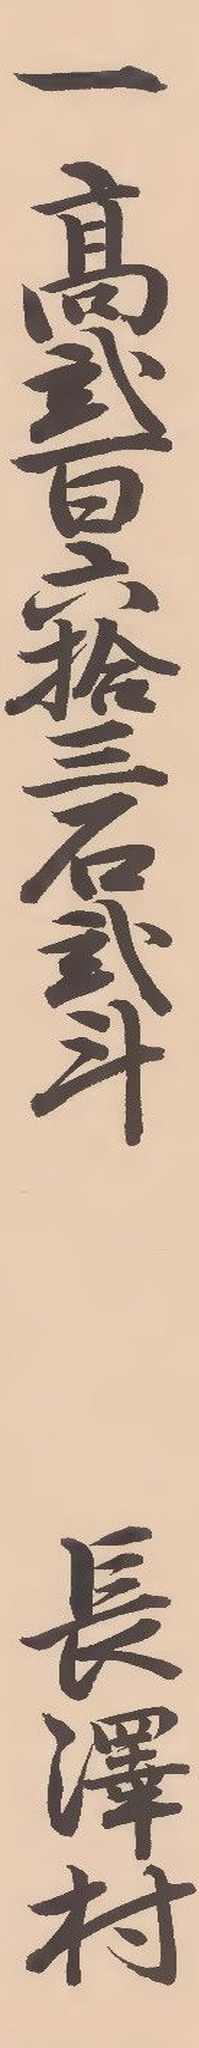一高弐百六拾三石弐斗長沢村
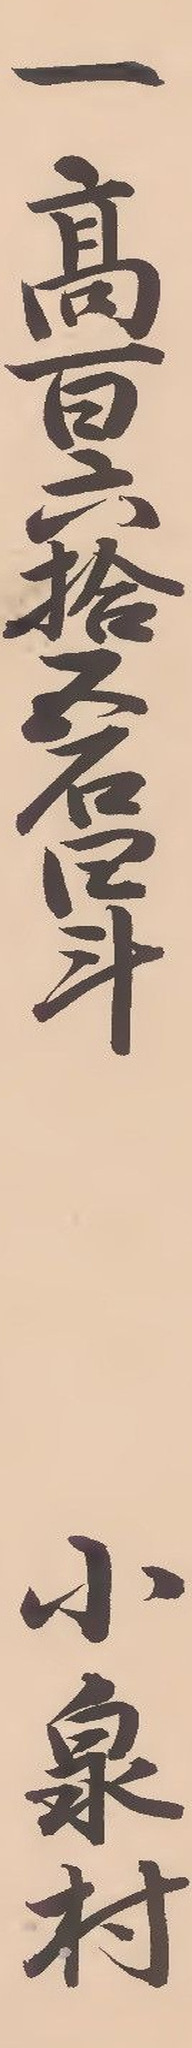一高百六拾五石四斗小泉村
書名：能登国郷帳
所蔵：国立公文書館 National Archives of Japan
